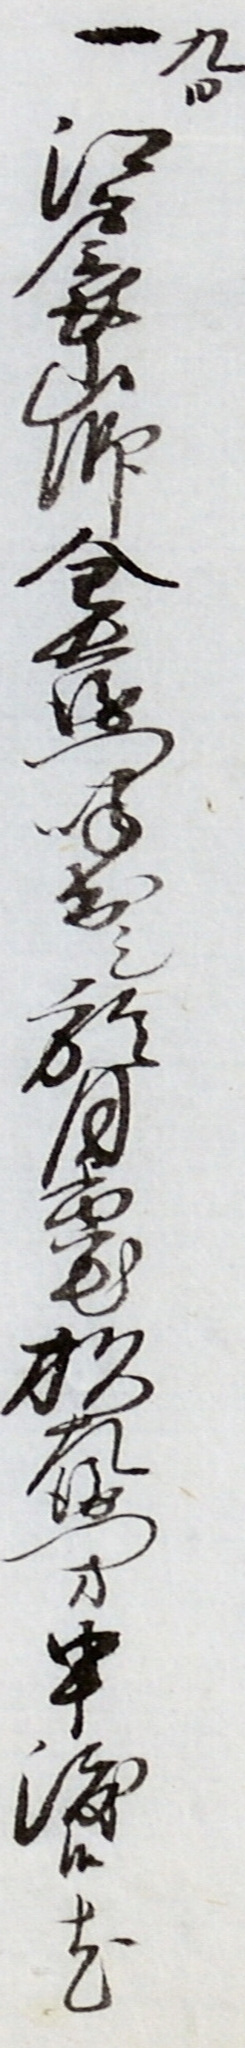一江戸表山師金右衛門呼出し於月番宅杉左衛門方申渡候尤
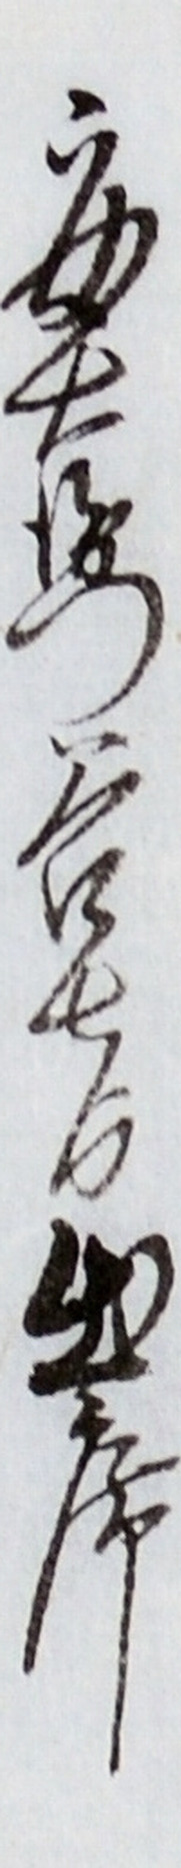安右衛門善右衛門出席
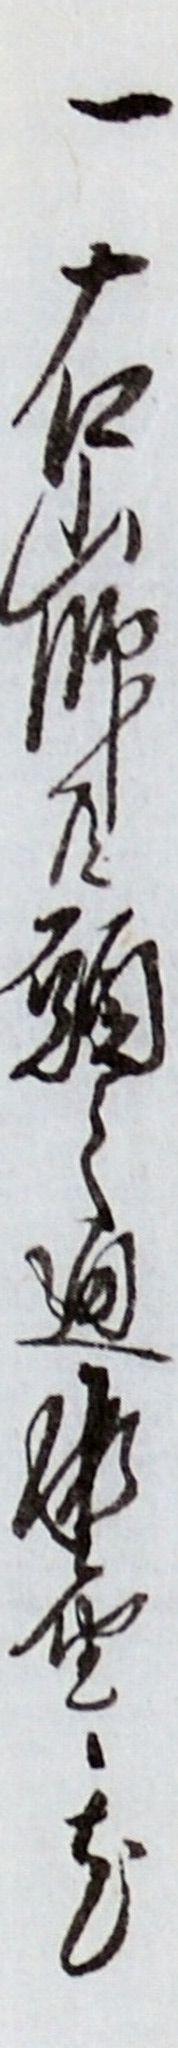一右山師共願之通承届候尤
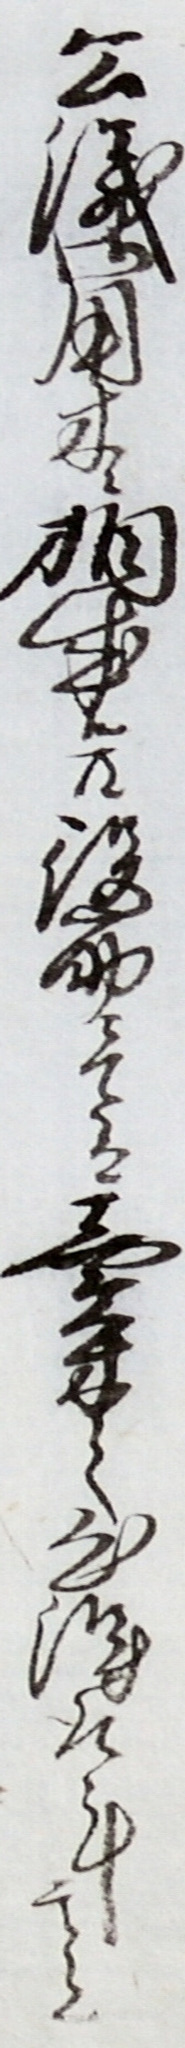公儀御用木ニ相成共役筋ニては年之心得取計其上
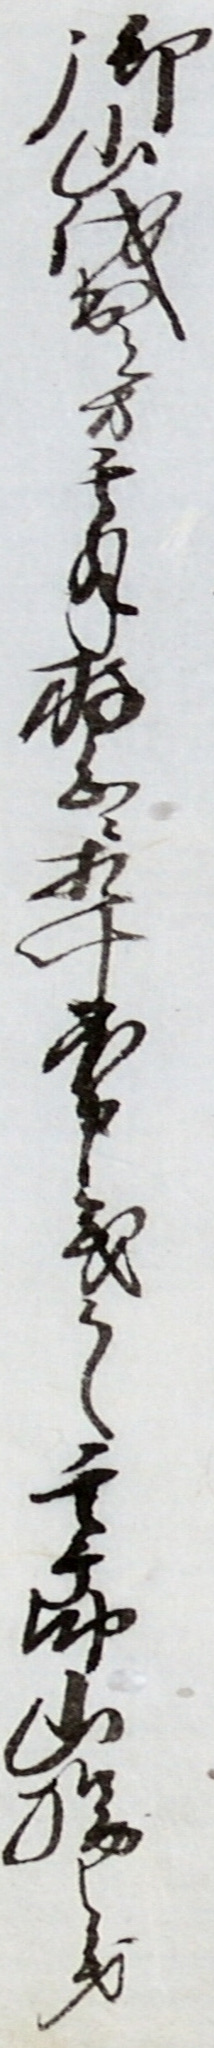御山伐出候共其外病子に相可申義よし其節山端之義
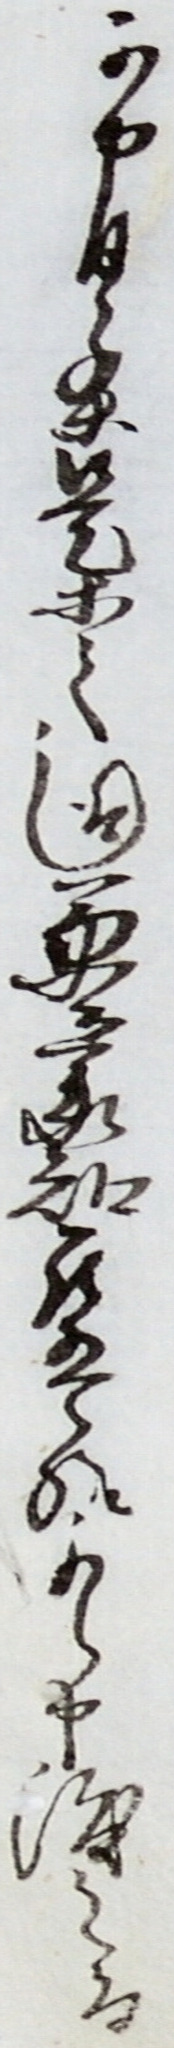可申付是等之趣要無承知罷有候様よら申渡之旨
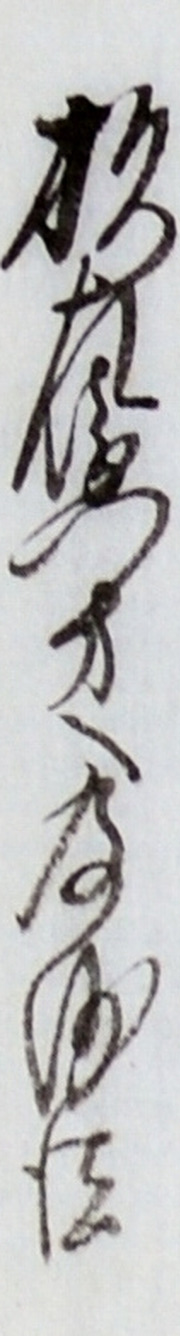杉左衛門方へ及沙汰

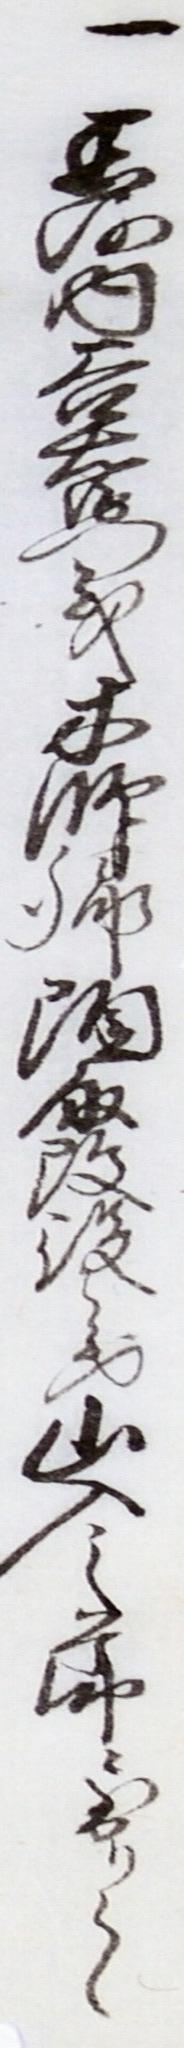一黒河内吉右衛門義木師帰頭取改役之義山入之節ニ至り候
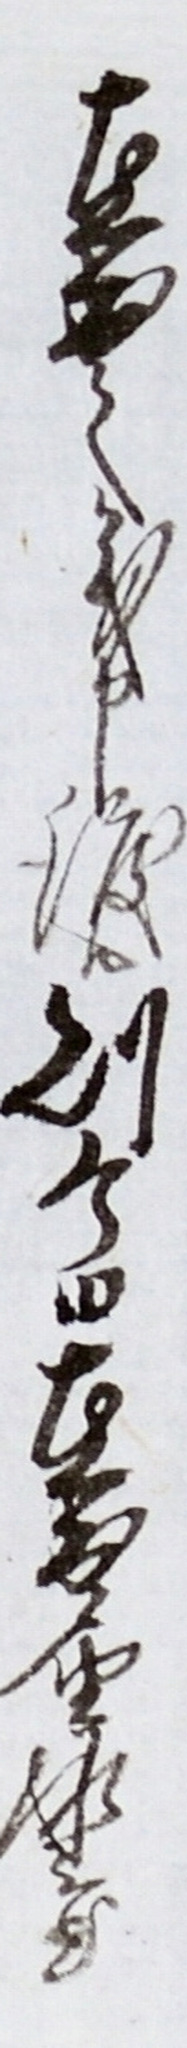在出之義申渡候則今日在番届承置
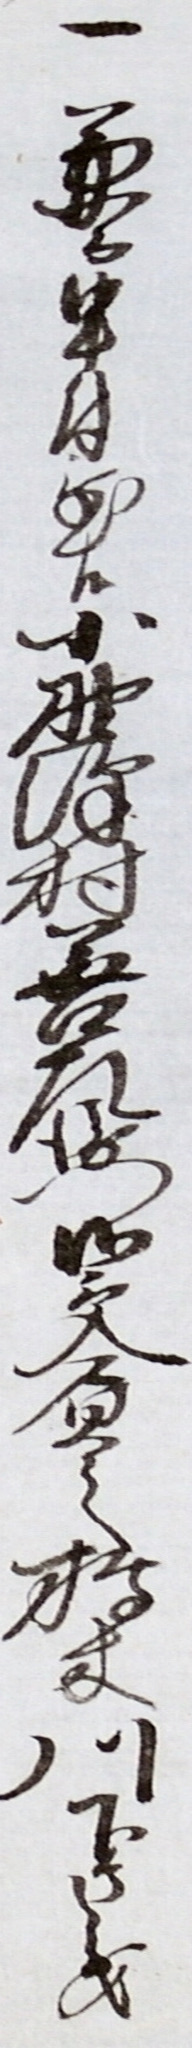一兼而申付置候小野沢村善左衛門御受負之木川下之義
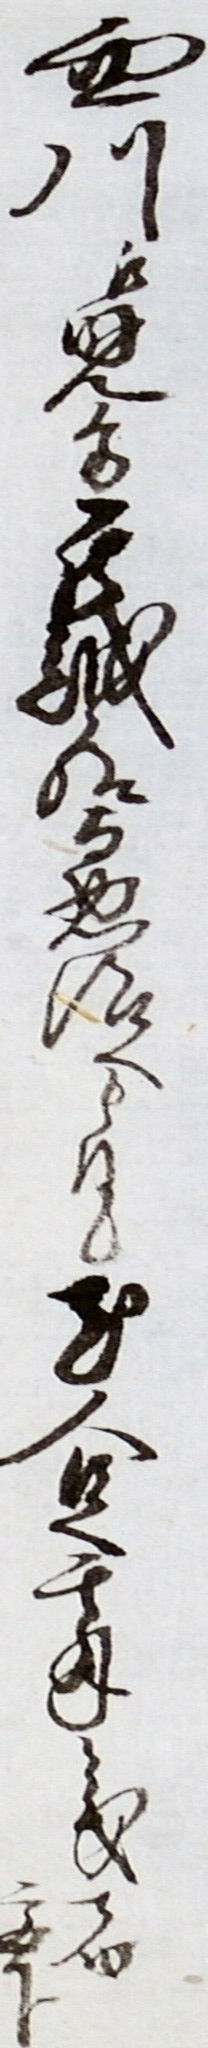面川江見分罷越候様与惣治へ申付候尤人足其外之義は宮下
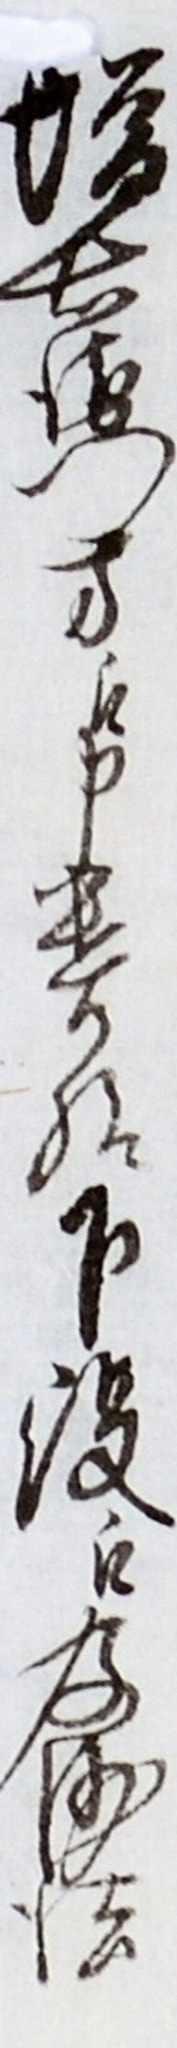増右衛門方江申遣候様下役江及沙汰
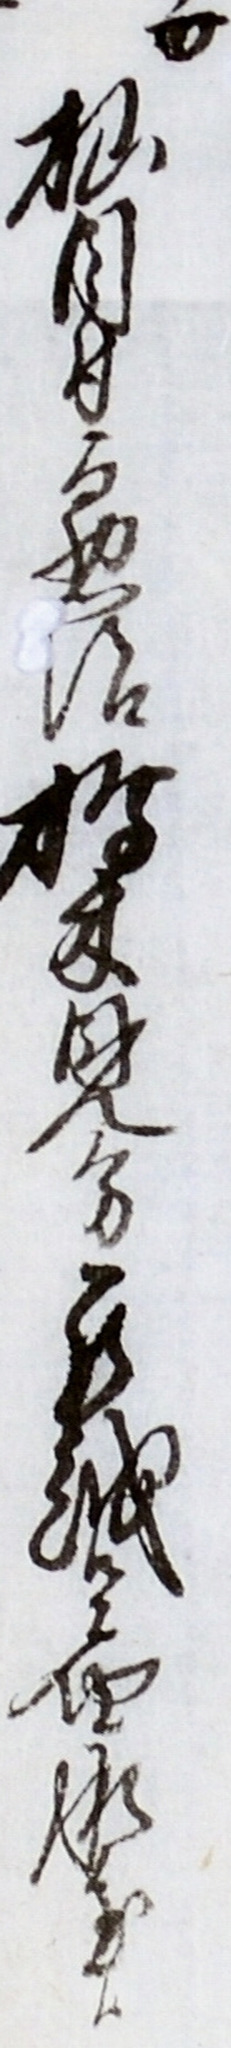杣目付与惣治木見分罷越候届承置候
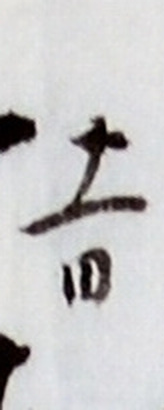十一日
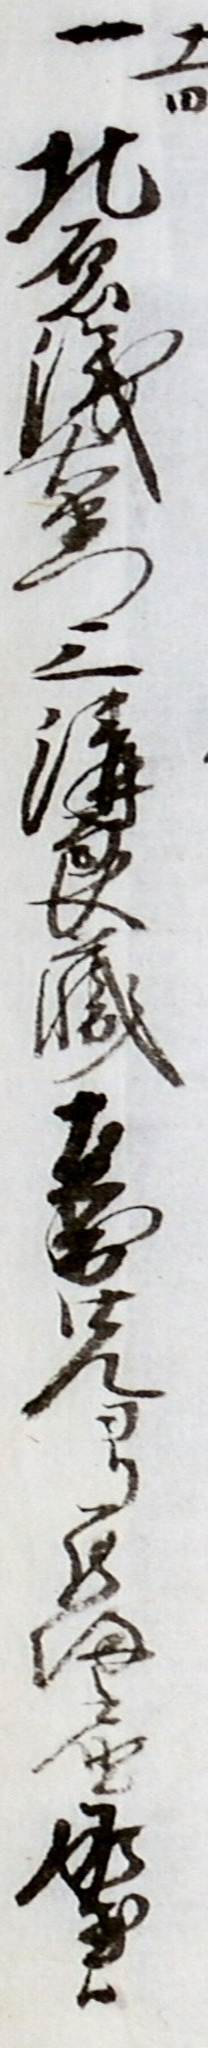一北原儀右衛門三溝良職罷出先ヨリ罷帰候届承置候
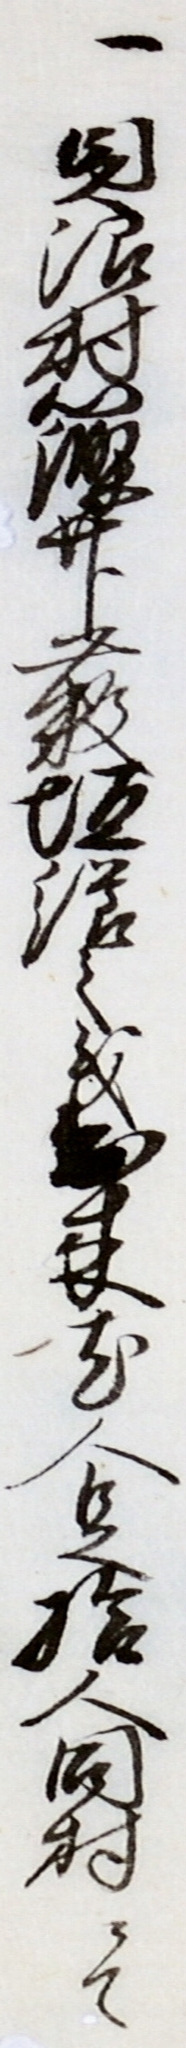一貝沼村郷竹薮垣潰之義出来尤人足拾人同村ニて
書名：御山奉行御用控
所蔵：伊那市立高遠町図書館・合同会社AMANE
